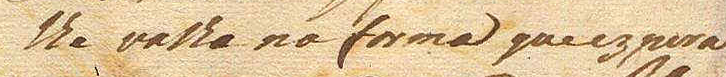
lhe valha na forma que ezpera
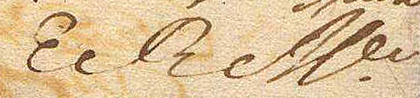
E R M.ce
